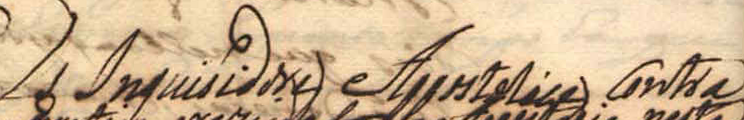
Os Inquisidores Appostolicos Contra
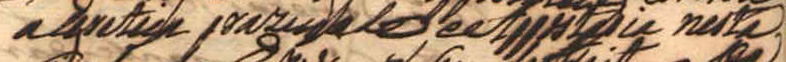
a heretica pravidade, e Appostasia nesta.
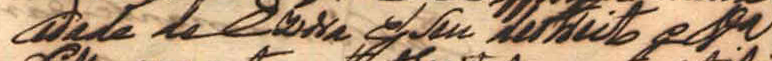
Cidade de Evora, e seu destricto e V.a
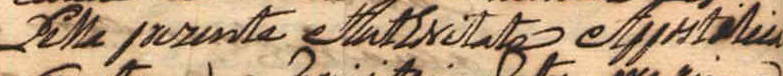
Pella prezente Authoritate Appostolica
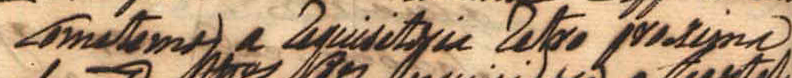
Cometemos a Requisitoria Retro proxima
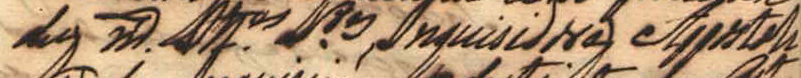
dos m.to Ill.os S.res, Inquisidores Appostoli
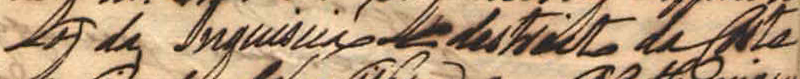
Cos da Inquisiçaõ e destricto da Corte
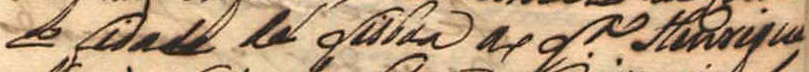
e Cidade de Lisboa ao L.o Henrique
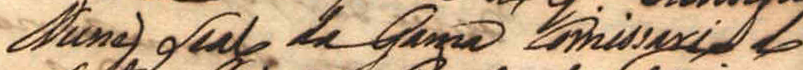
Nunes Leal da Gama Comissario do
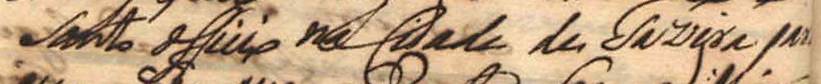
Santo officio na Cidade de Tavira pa
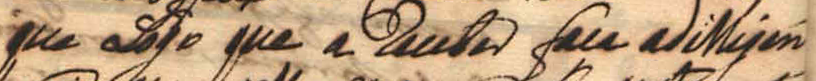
que Logo que a Receber faça a dilligen
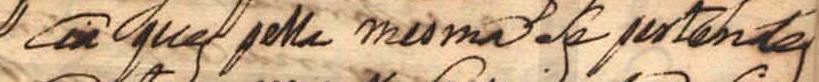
Cia que pella mesma se pertende
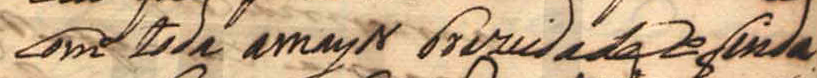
Com toda a mayor brevidade e finda
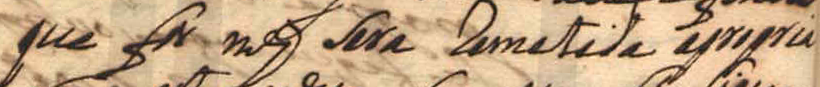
que for nos sera Remetida a propria
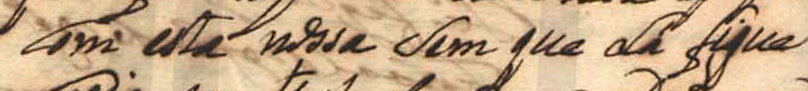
Com esta nossa Sem que Lá fique
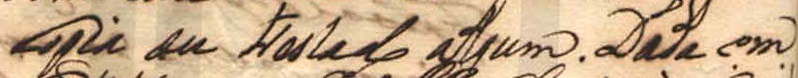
Copia ou treslado algum. Dada em
